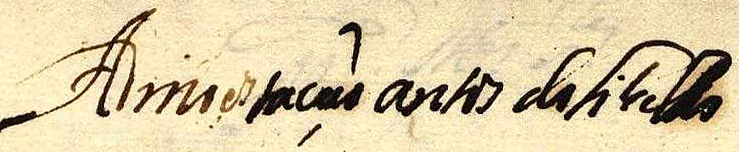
Admoestaçaõ antes do libello
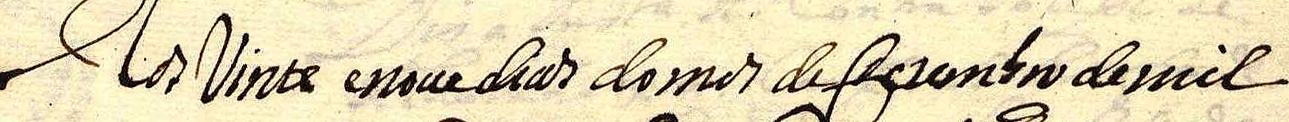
Aos Vinte e noue dias do mes de Dezembro de mil
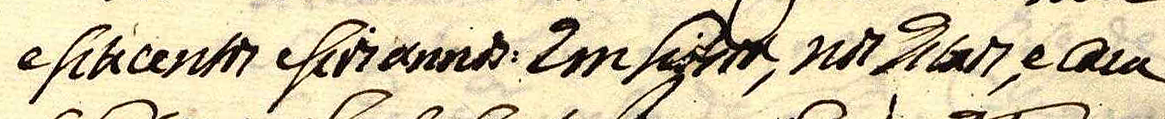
e setecentos e seis annos. Em lisboa, nos Estaos, e caza
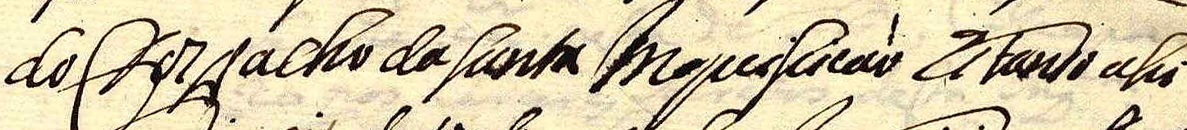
do Despacho da santa Inquissiçaõ estando ahi
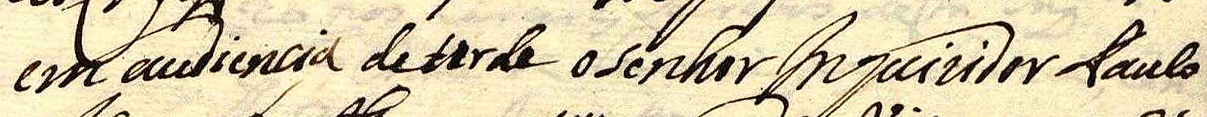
em audiencia de tarde o senhor Jnquizidor Paulo
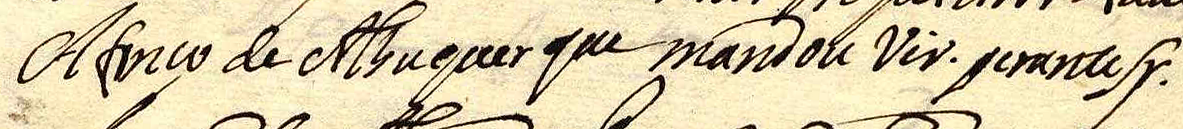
Afonço de Albuquerque mandou vir. perante sy
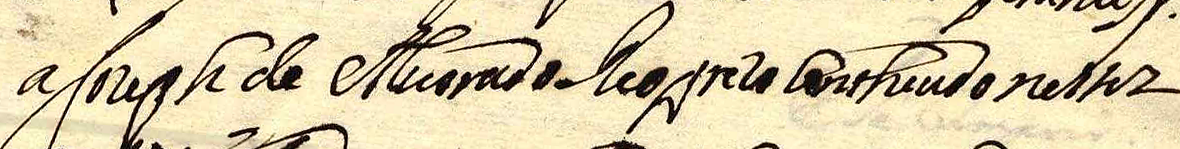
a Jozeph de Aluarado Reo prezo Contheudo nestez
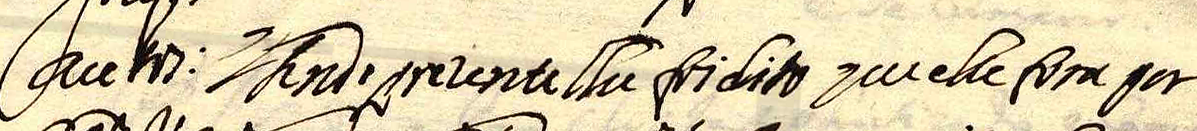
autos: E sendo prezente lhe foi dito que elle fora por
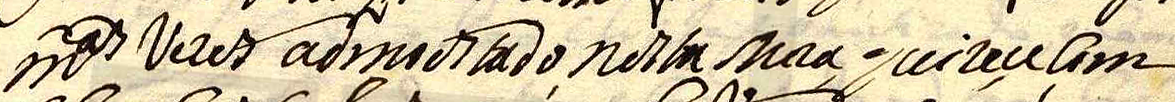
mtas vezes admoestado nesta Meza quizece Com
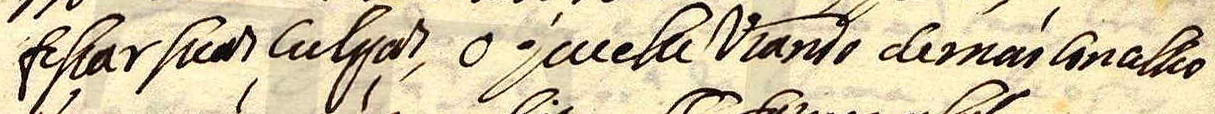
fessar suas culpas, o que elle Vzando de maó concelho
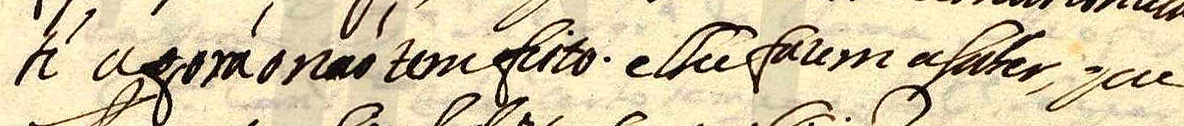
té agora o naõ tem feito. e lhe fazem a saber, que
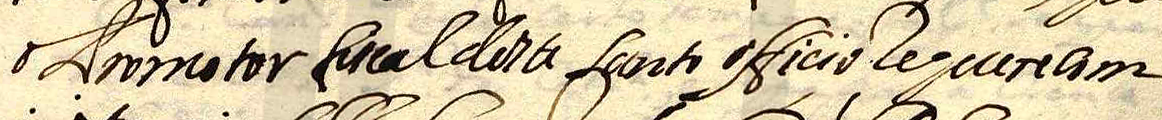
o Promotor fiscal deste santo officio Requere com
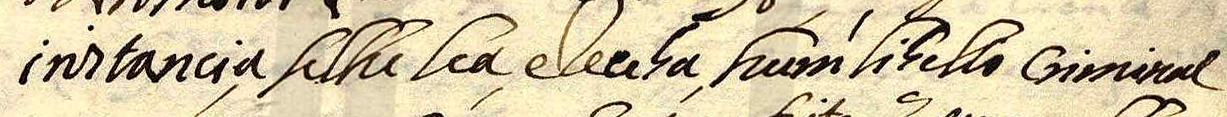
instancia se lhe lea e Receba, hum libello criminal
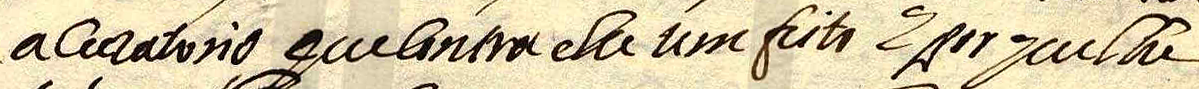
acuzatorio que contra elle tem feito E porque lhe
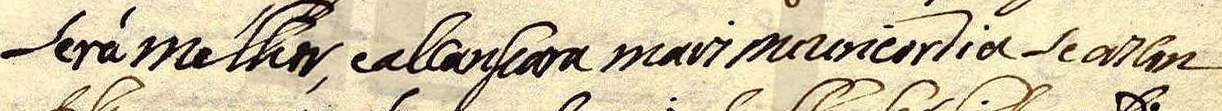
será melhor, e alcanssara mais mesericordia se as con
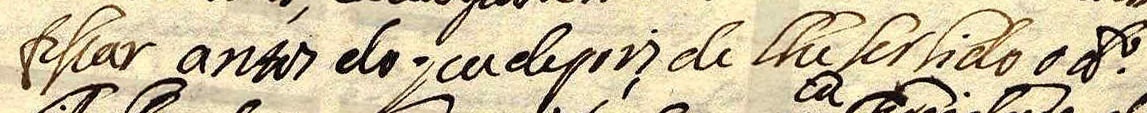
fessar antes do que depois de lhe ser lido o d̄.o
